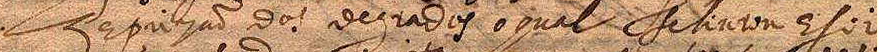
E prizaõ dos degredos o qual se liurou E foi
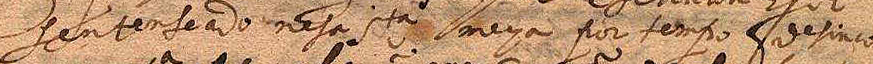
sentenseado nesa sta meza por tempo de sinco
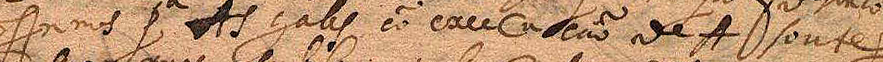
Annos pa As gales cō excecuçaõ de Asoutes
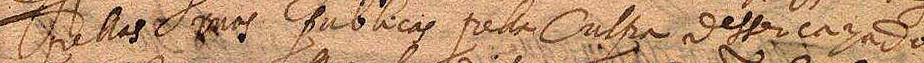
pellas ruas publicas pella Culpa de sser cazado
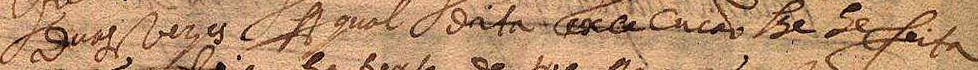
duas vezes A qual dita excecução lhe he feita
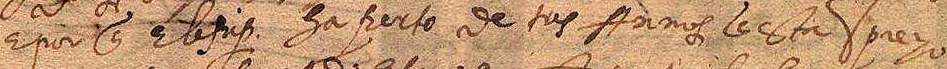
E porq̄ Ele sup. ha perto de tres Annos q̄ esta prezo
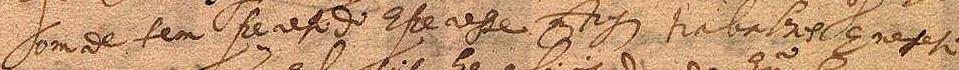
omde tem peresido E peresse mtos trabalhos E nesesi
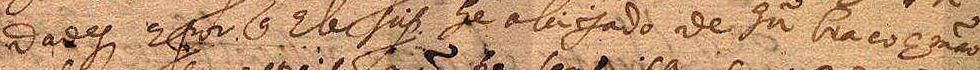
dades E porq̄ Ele sup. he aleijado de hū braço E mão
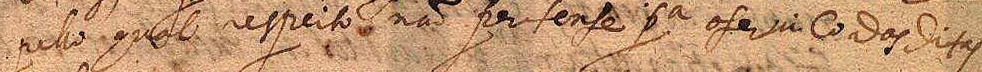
pello qual respeito naõ pertense pa o seruico das ditas
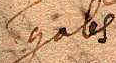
gales
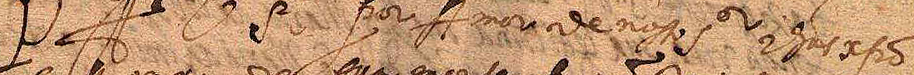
P A V Sa por Amor de nosso sor ihūs xpō
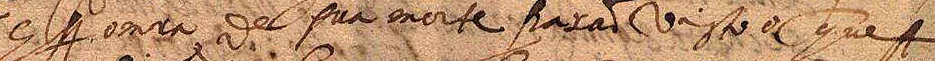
E A omra de sua morte paxaõ visto o que A
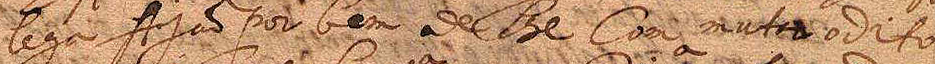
lega Ajaõ por bem de lhe Commutar o dito
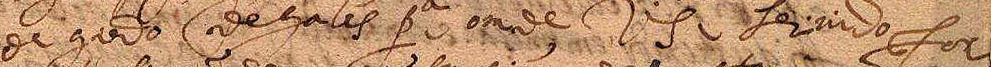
degredo de gales pa omde V Sa seruido for
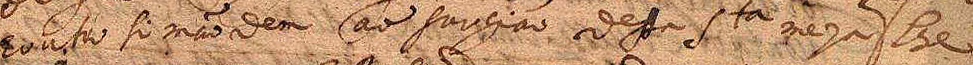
E outrosi maõdem ao suregiaõ dessa sta meza lhe
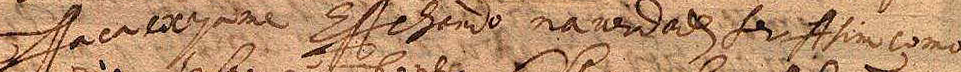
ffaça exzame E Achando na uerdade ser Asim como
